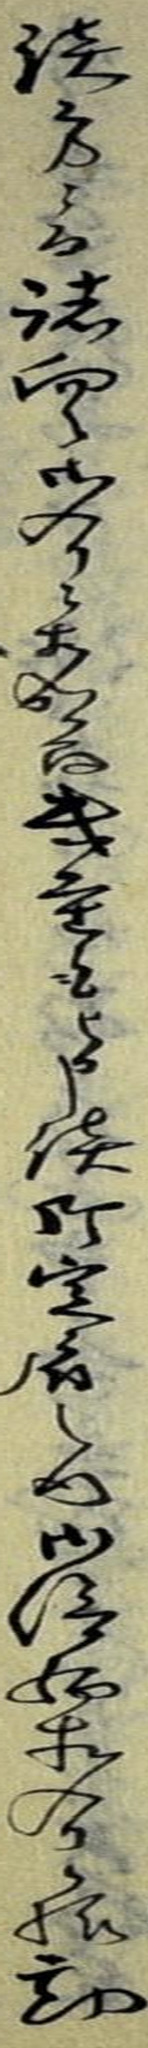談方に而諸向へ御〆りに相成候間幾重にも被申談御定府之内御倹約相〆り候様勘
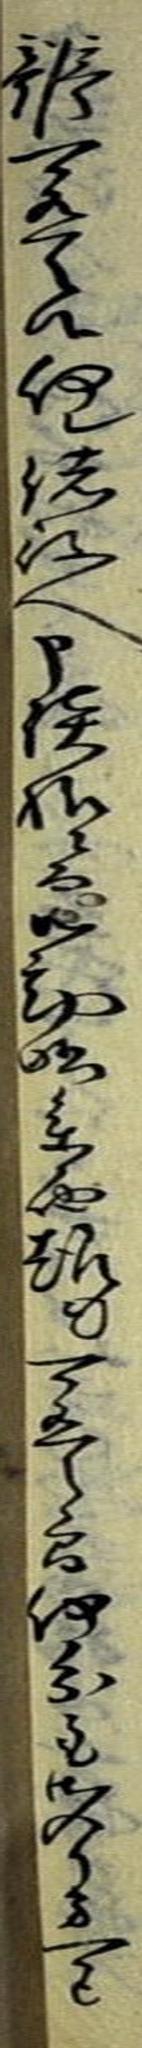弁可有之候何れ諸役人申談様に而御勘略参届趣も可有之候間何分にも御〆り方可被
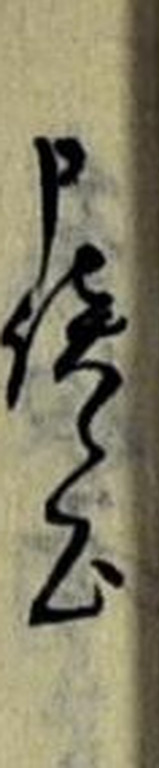申談候以上
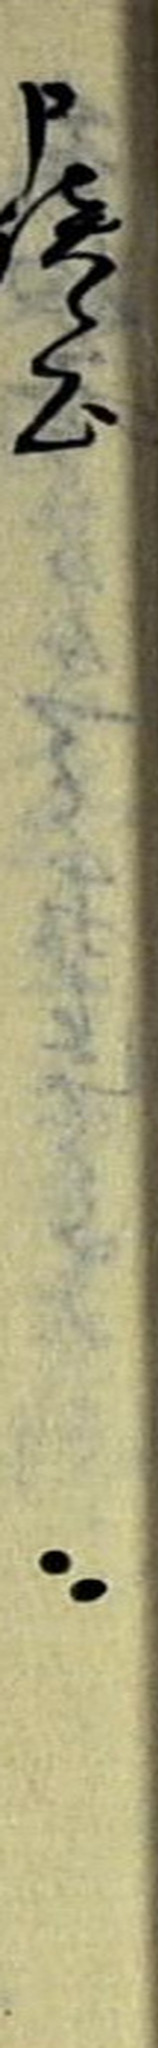申談候以上
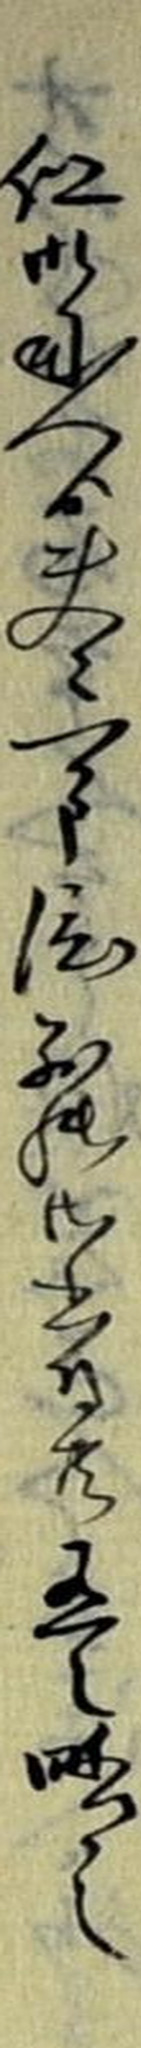但御用人ゟ夫々可申渡別紙御書付共有之略之
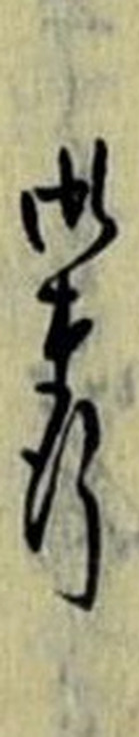御奉行
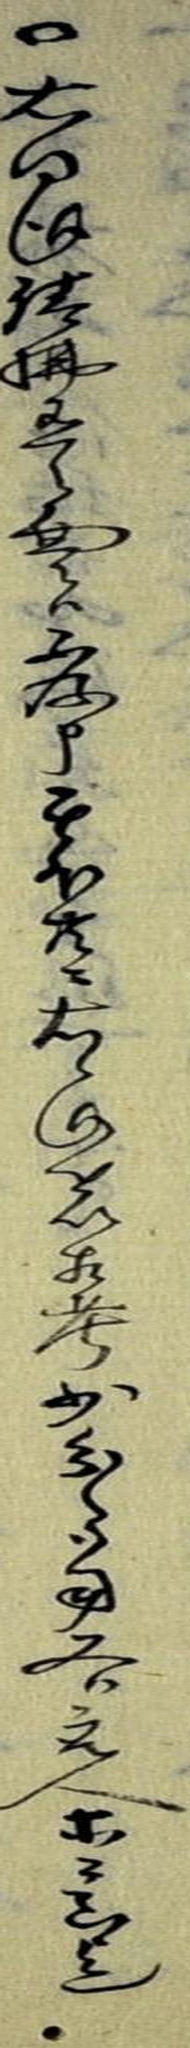〇右同趣請払有之面々は不及申其外共に右之趣を以相考少分之御用又は取人等に至迄
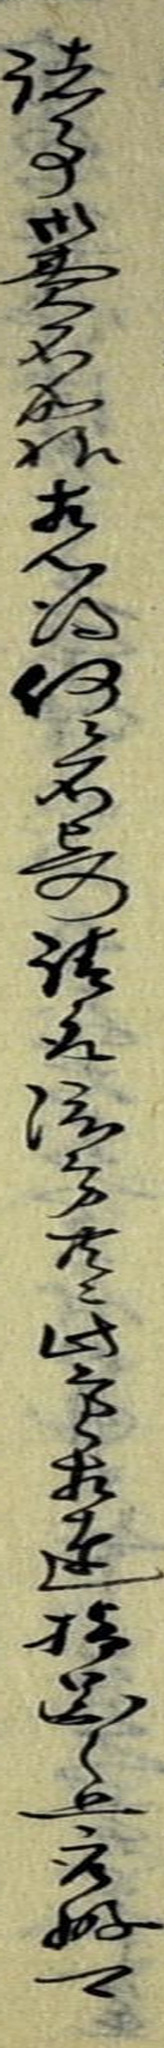諸事御費不成様相心得何に不寄請取渡方共に此方へ相達指図之上取扱可
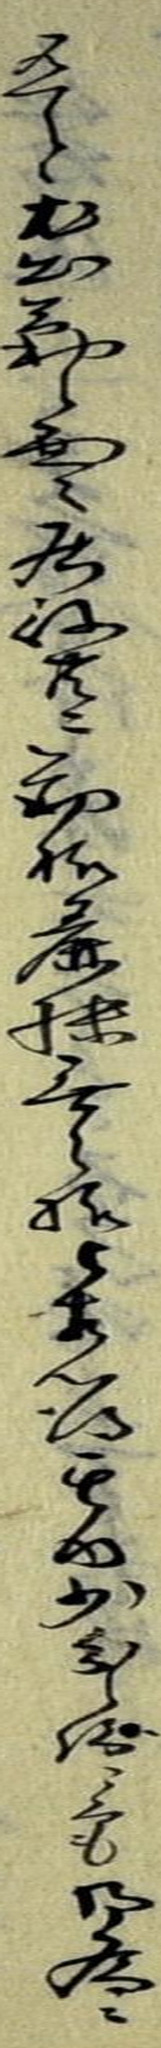有之候尤出勤之面々居役共に勤様麁抹無之様被相心得其内少分之儀に而も御為に
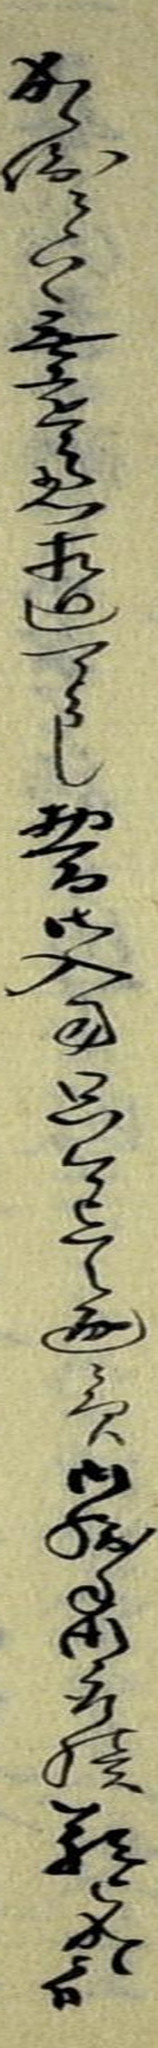成候儀に候はゝ無遠慮相廻可被申候惣而御入用只今迄之通に而は御勝手御取続難被成候に付
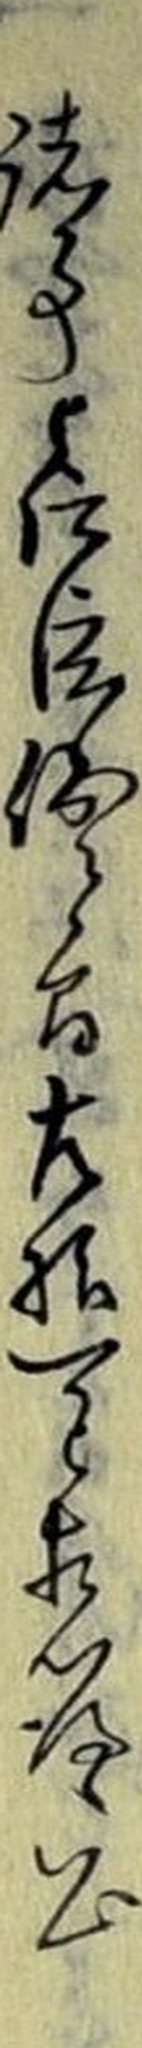諸事被仰渡儀に候間左様可被相心得候以上
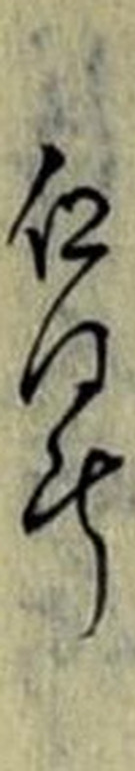但同断
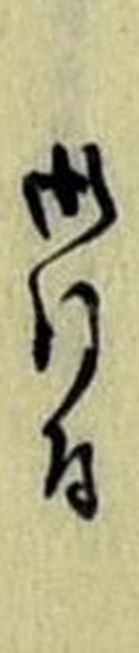御目付
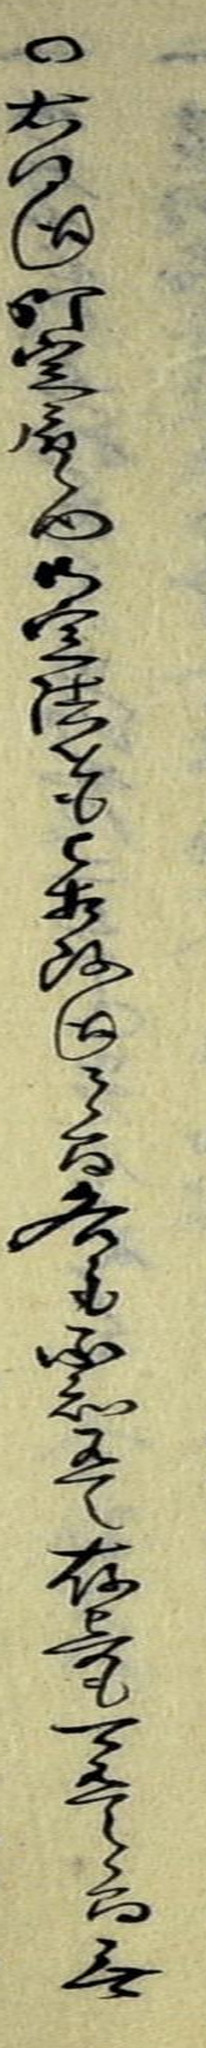〇右同趣御定府之内御定法とも被相改趣に候間各も承知有之存寄も可有之候間無
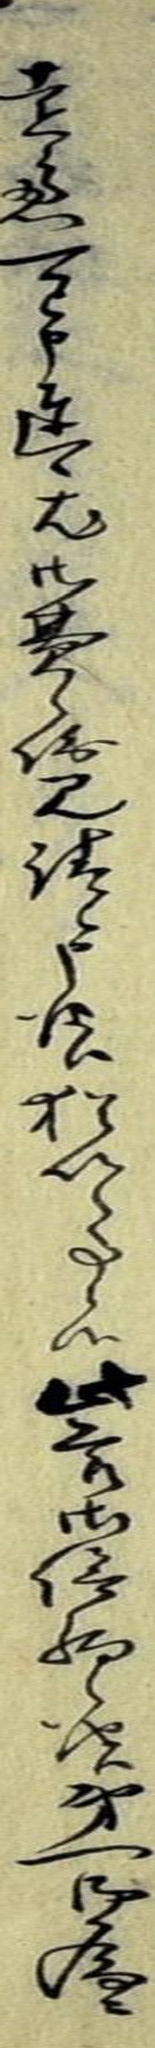遠慮可被申達候尤御費之儀見請被申儀は猶以之事に候此節御倹約之儀は第一御為に
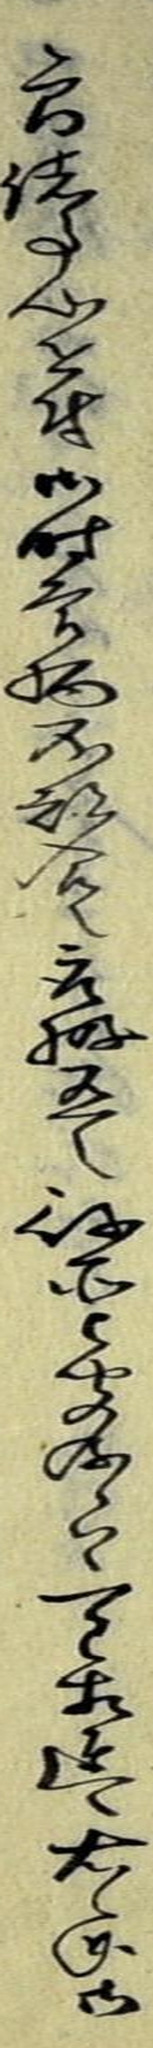候間諸事心を付御時節柄不都合之取扱有之役所被聞及候はゝ可被相達候右之趣御
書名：命令之部 二
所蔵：福井県文書館 Fukui Prefectural Archives
